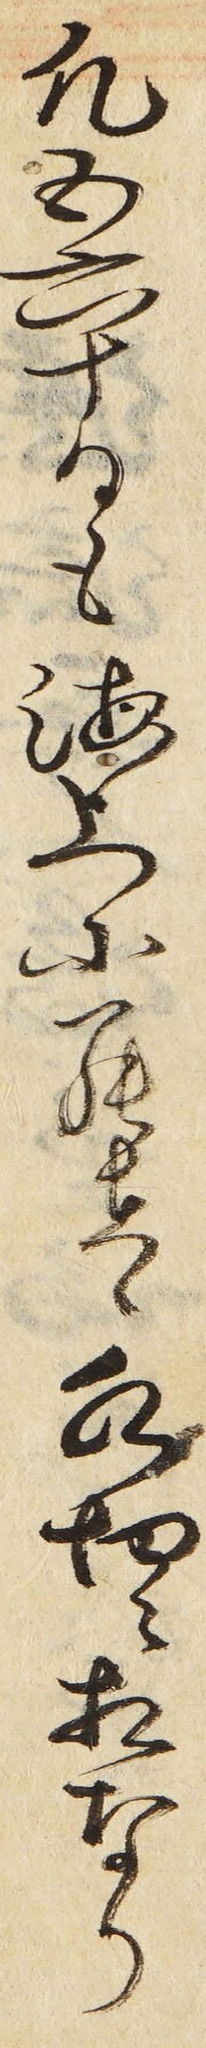凡五六十日も海上に罷在候水切ニ相なり
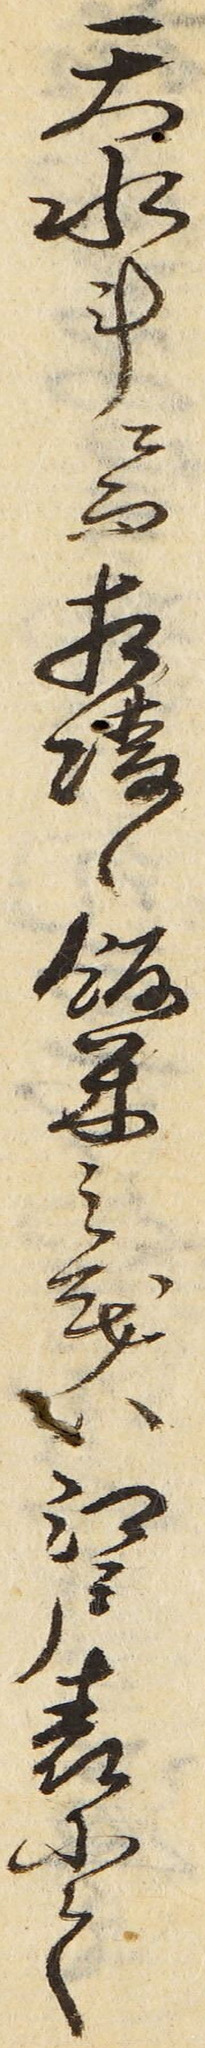天水斗ニ而相凌候飯米之義ハ江戸表にて
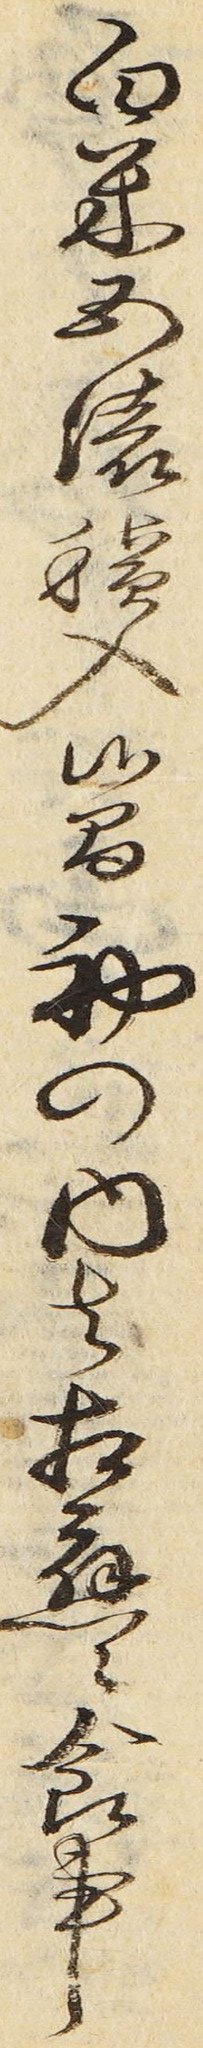白米五俵積入候間初の内者相応ニ食事
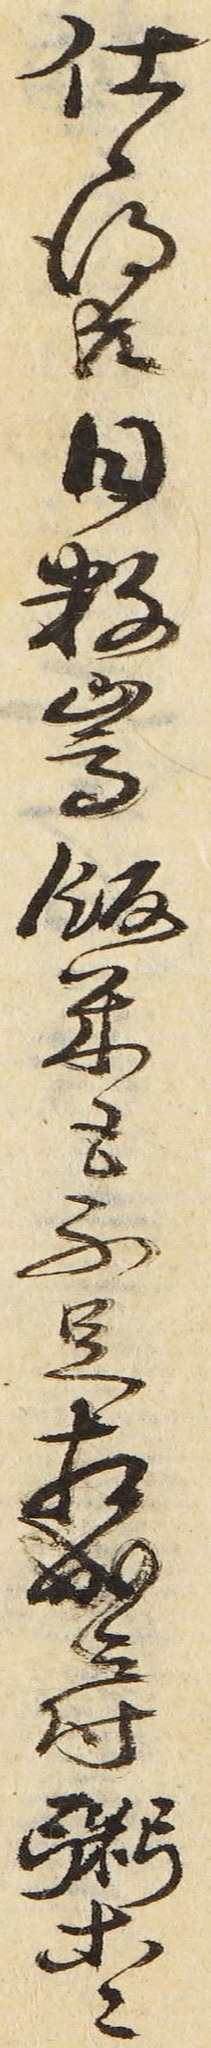仕候得共日数嵩飯米も不足相成ニ付粥等ニ
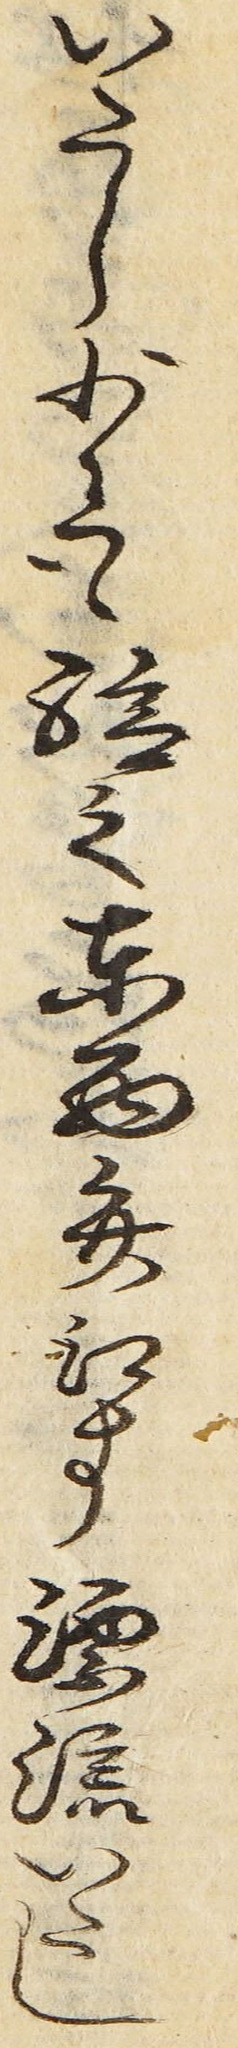いたし少々ツヽ給之東西弁えす漂流いたし
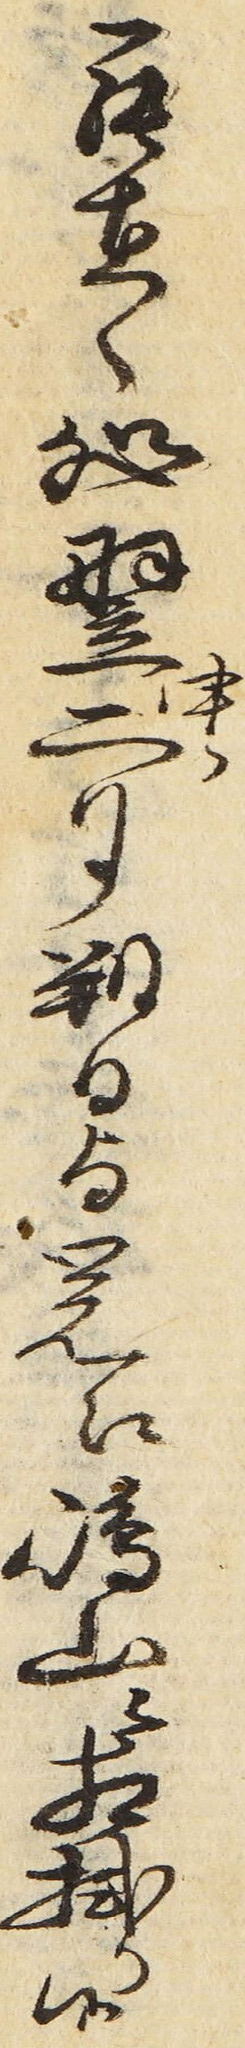罷在候処翌申か二月朔日与覚江嶋山ニ相掛り候
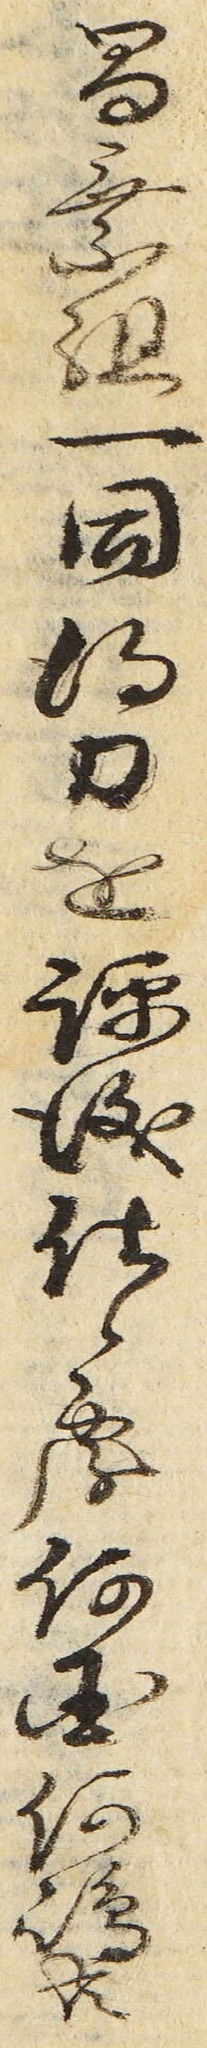間乗組一同得力を評儀仕候処何国何嶋共
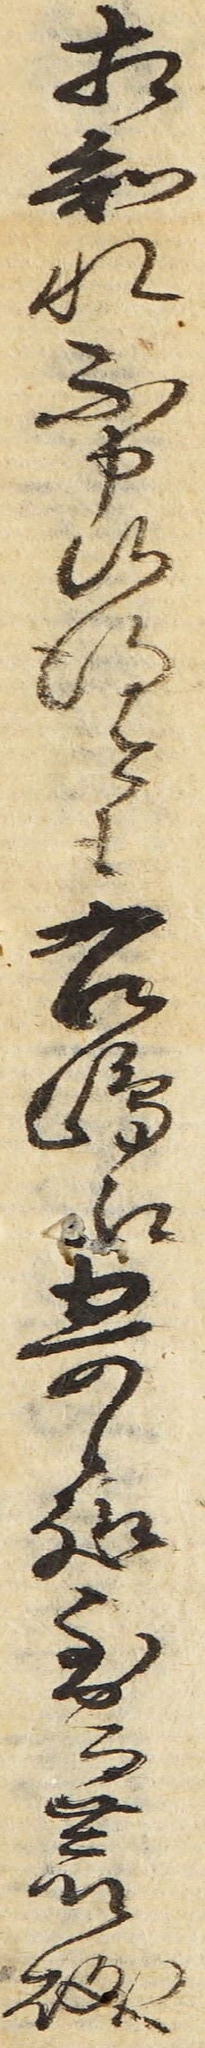相知れ不申候得とも右嶋江寄候処至而荒磯

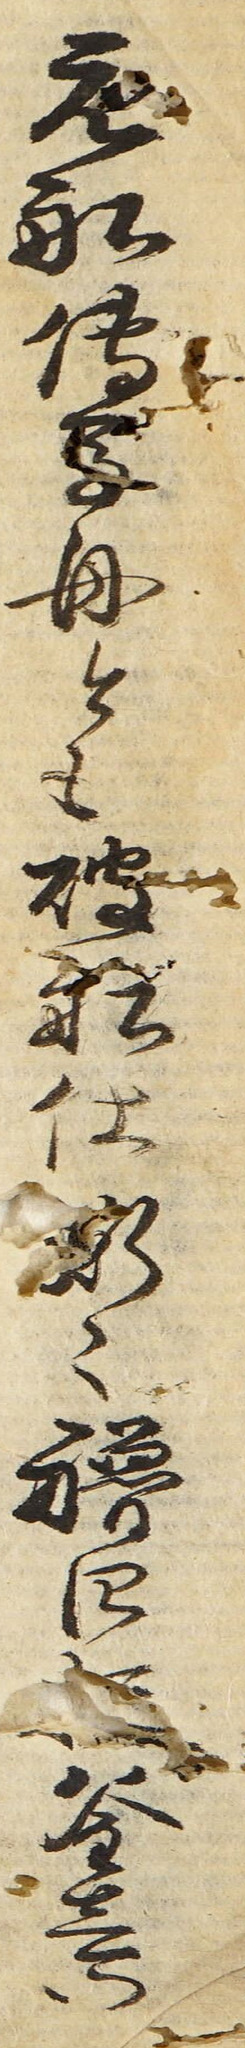元船伝馬舟とも破船仕々艪四挺釜壱ツ
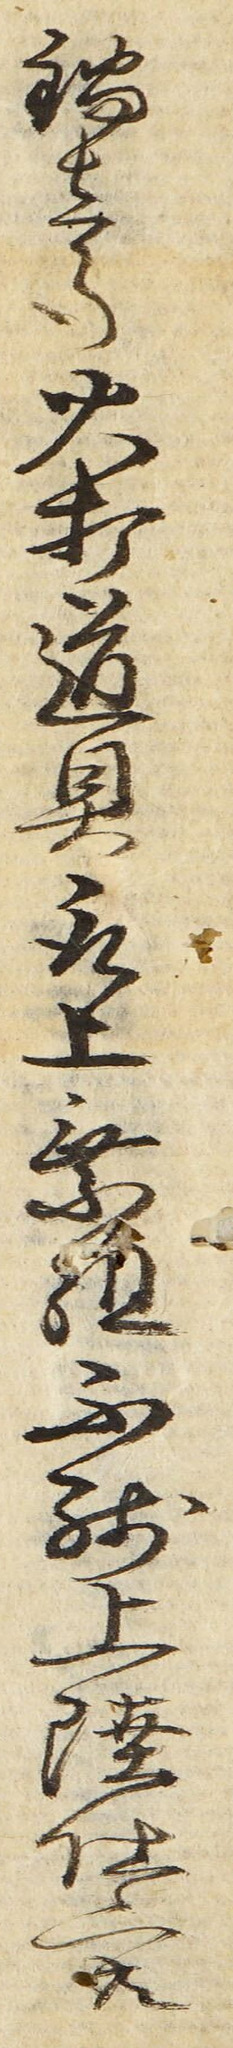鍋壱ツ火打道具取上乗組不残上陸仕候へ共
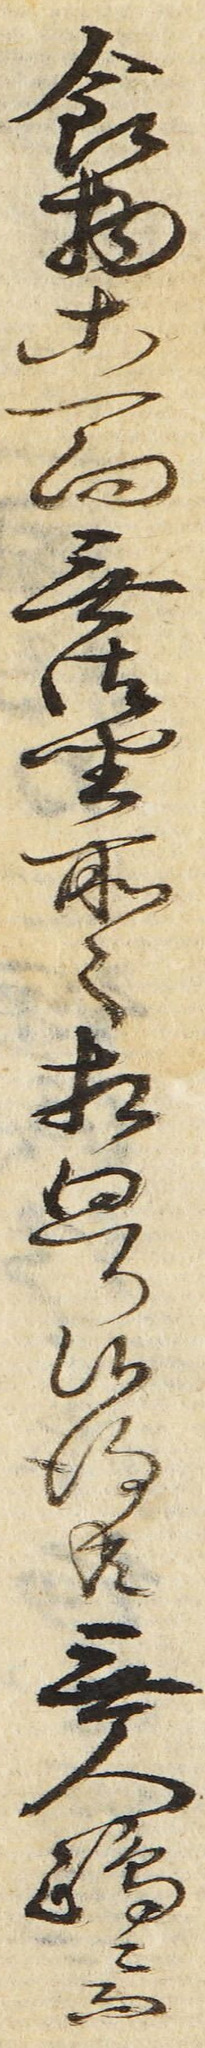食物等一向無御座所々相廻り候得共無人嶋ニ而
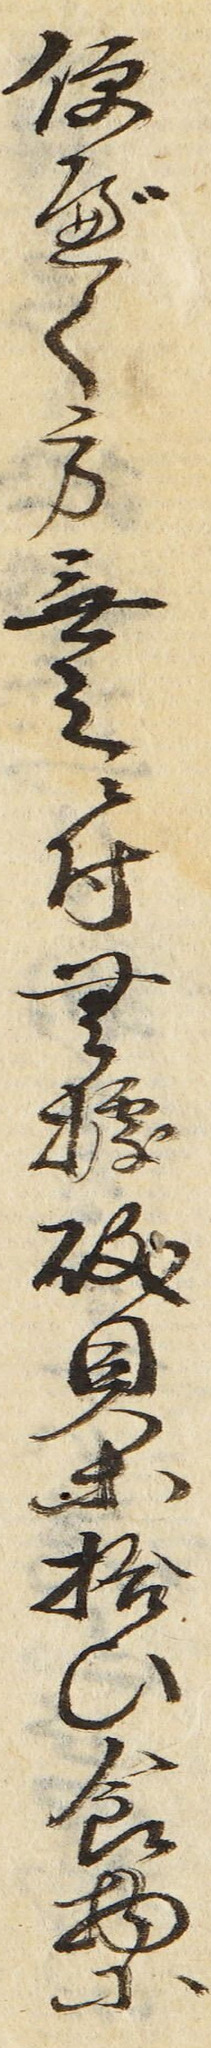便べく方無之ニ付無拠磯貝等拾ひ食物に
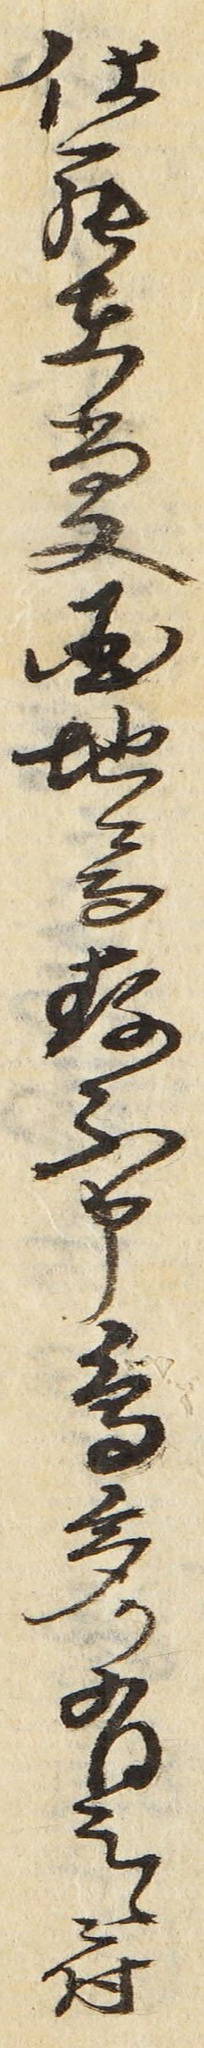仕罷在尚又国地ニ而存不申鳥多ク有之候ニ付
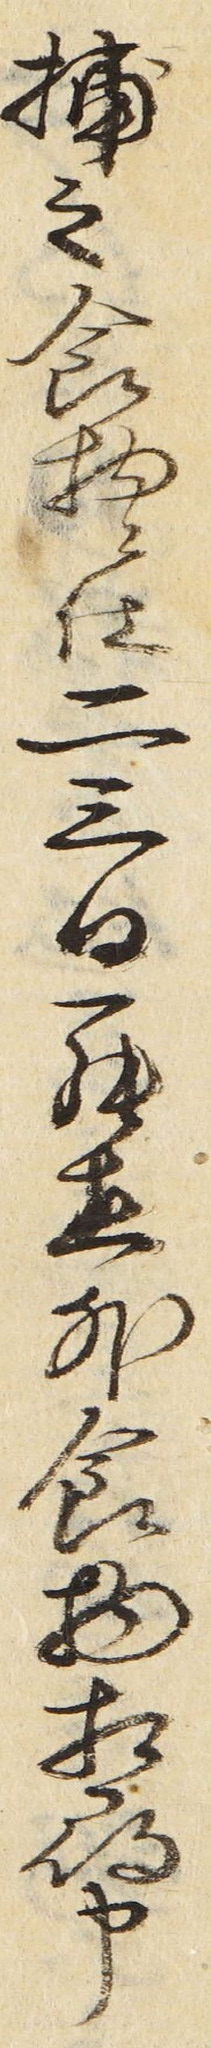捕之食物ニ仕二三日罷在外食物相尋申
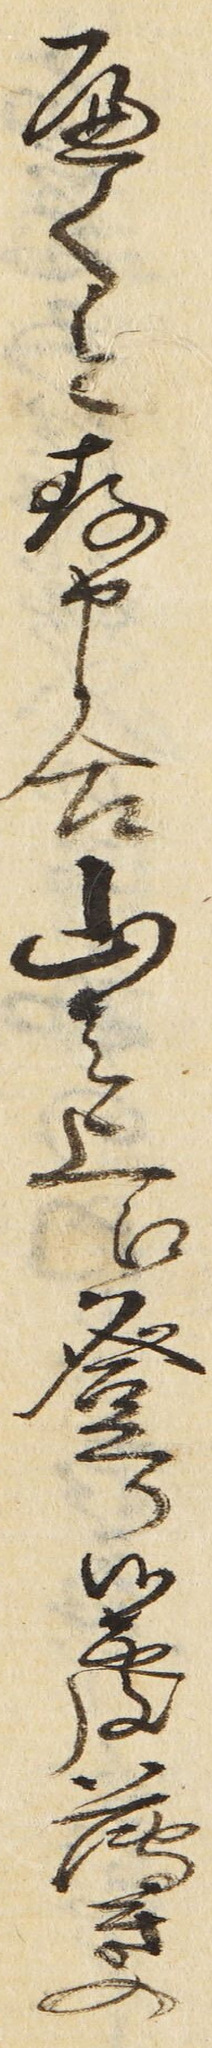へくと存申合山之上江登り候処薄きの
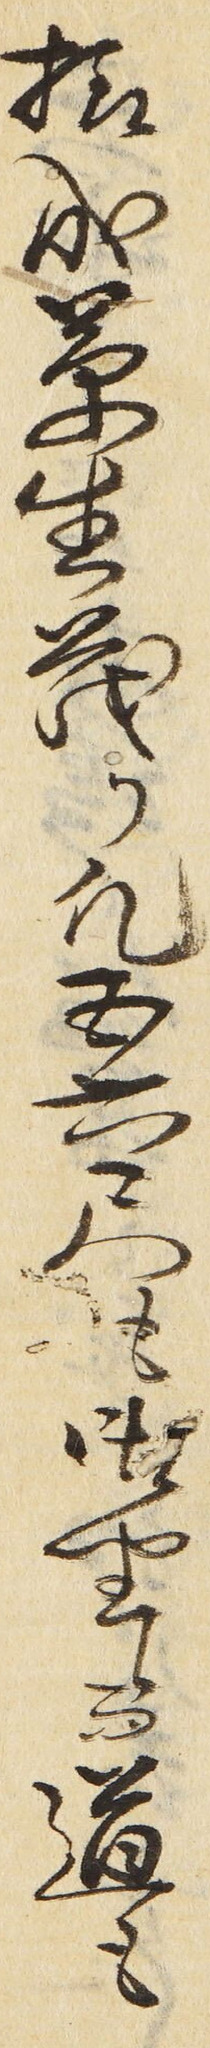様成草生茂り凡五六尺も御座候而道も
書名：漂流一件上書
